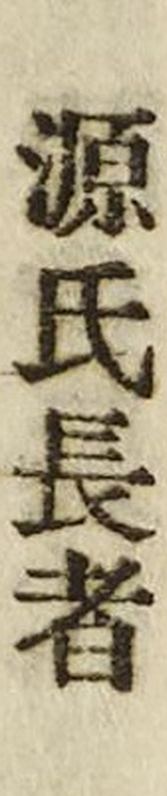源氏長者
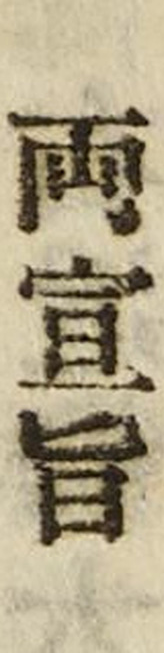両宣旨
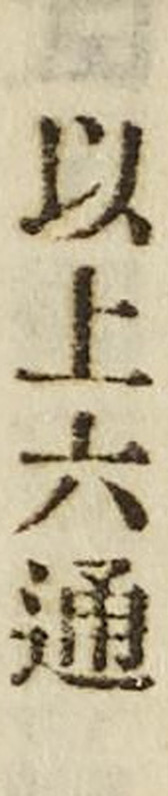以上六通
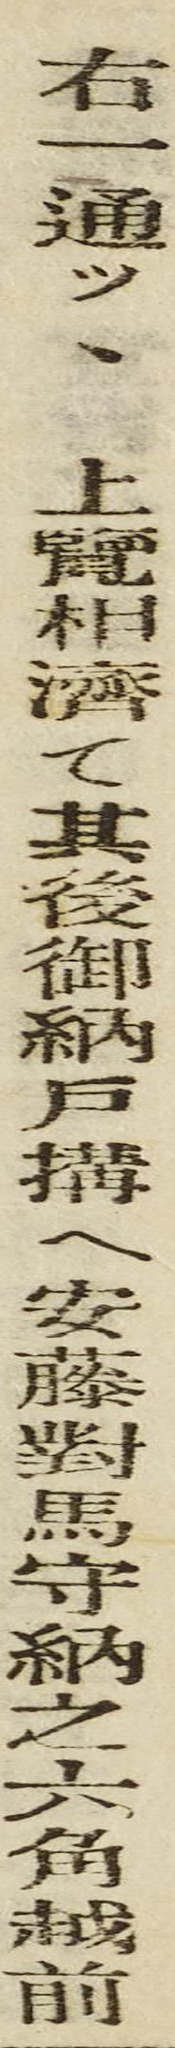右一通ツヽ上覧相済て其後御納戸搆へ安藤対馬守納之六角越前
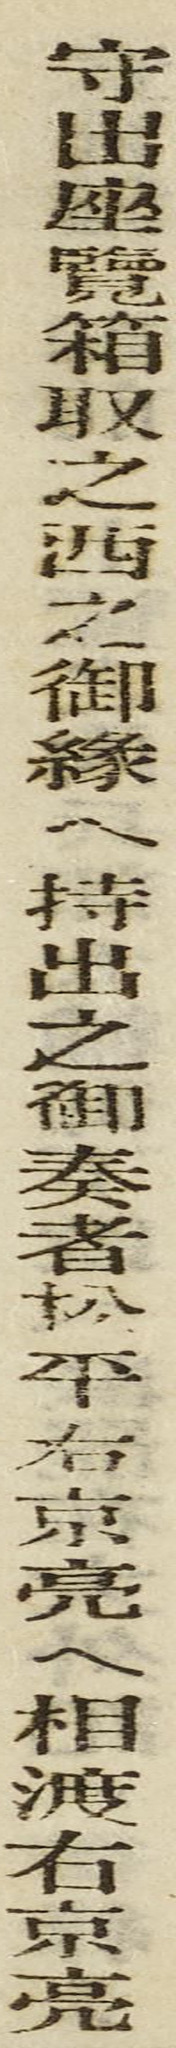守出座覧箱取之西之御縁へ持出之御奏者松平宇京亮へ相渡右京亮
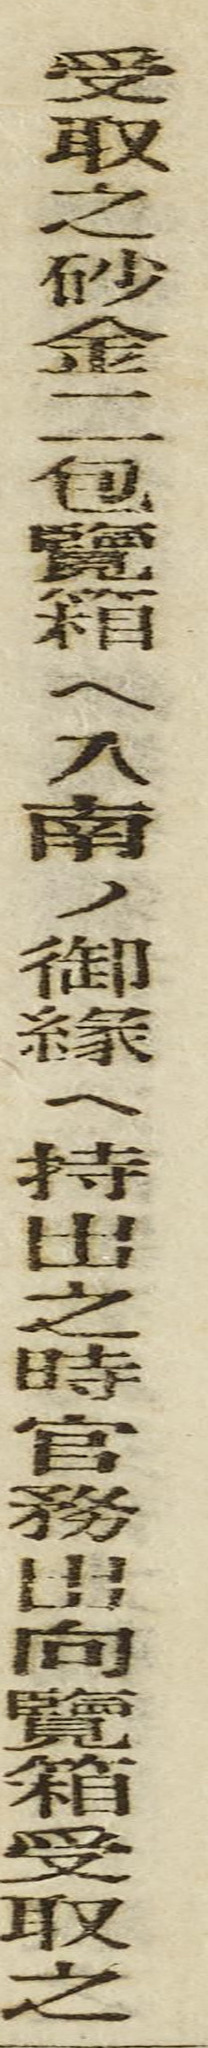受取之砂金二包覧箱へ入南ノ御縁へ持出之時官務出向覧箱受取之
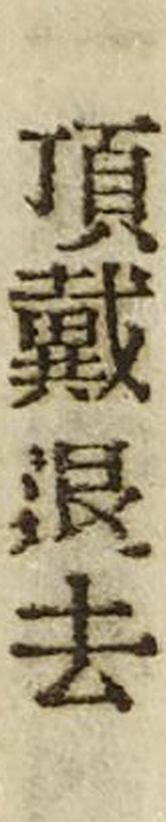頂戴退去

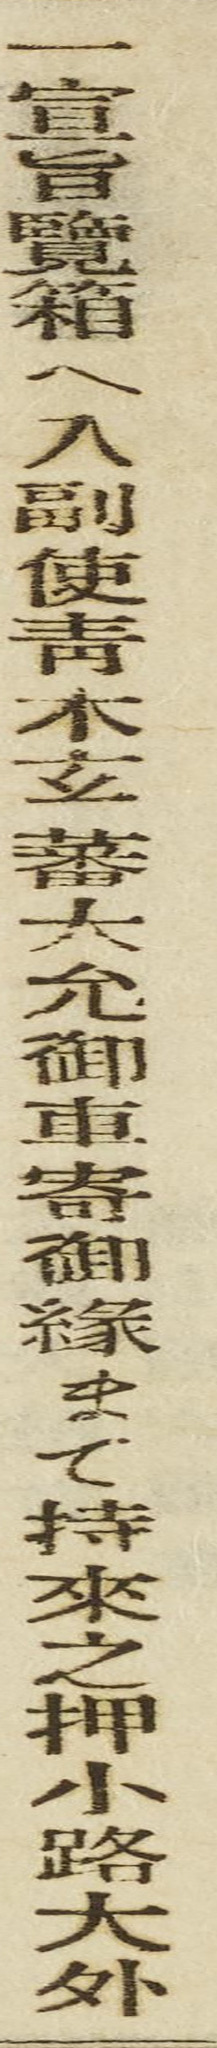一宣旨覧箱へ入副使青木玄蕃大允御車寄御縁まて持来之押小路大外
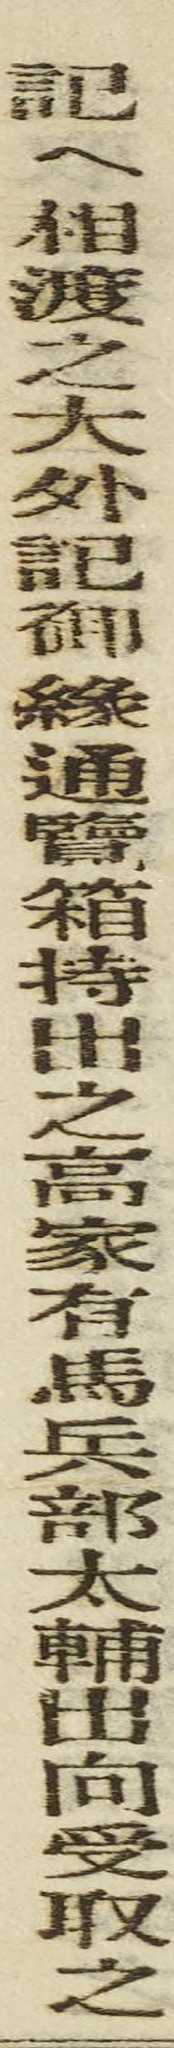記へ相渡之大外記御縁通覧箱持出之高家有馬兵部太輔出向受取之
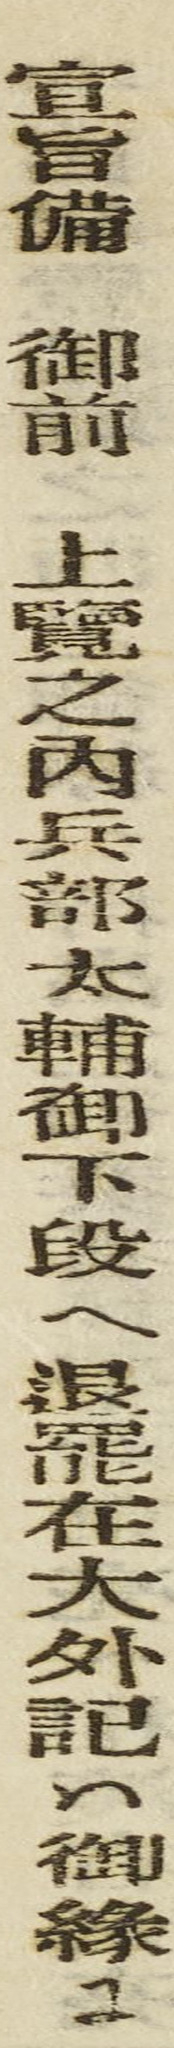宣旨備御前上覧之内兵部太輔御下段へ退罷在大外記は御縁に
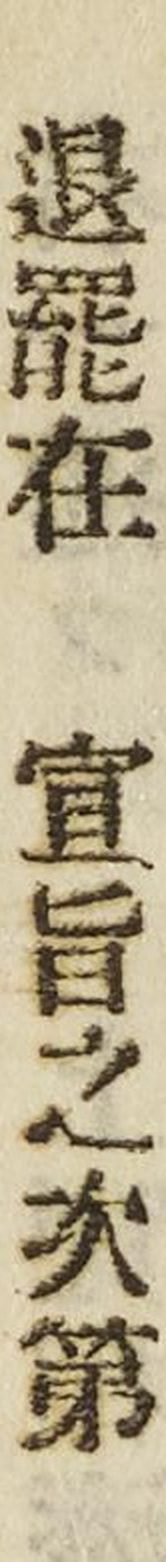退罷在宣旨之次第
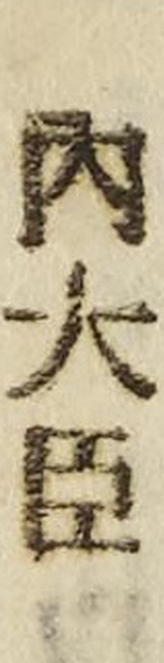内大臣
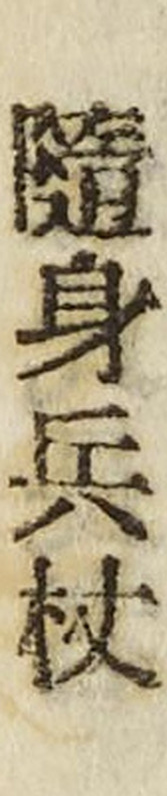随身兵杖
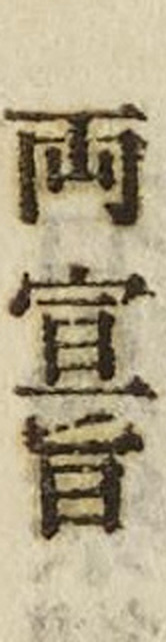両宣旨
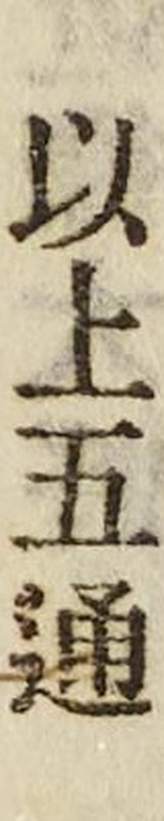以上五通
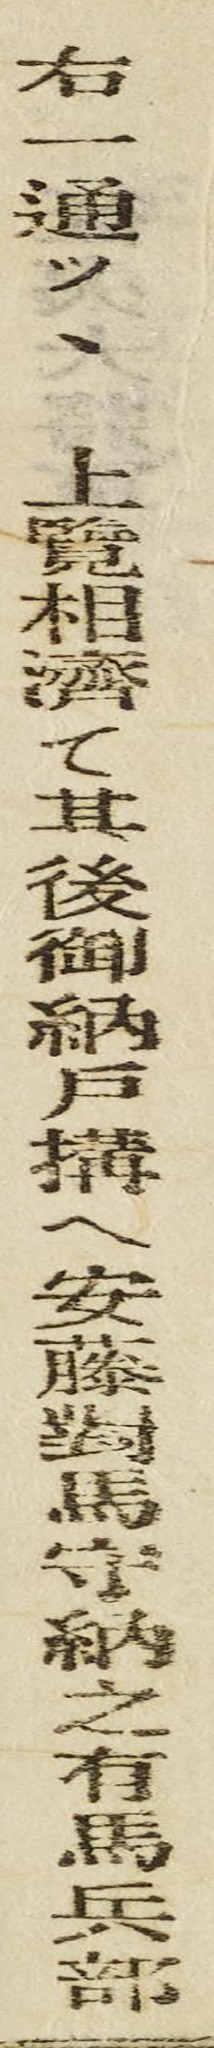右一通ツヽ上覧相済て其後御納戸搆へ安藤対馬守納之有馬兵部
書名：史籍集覽　朝鮮陣古文・細井廣澤記・颶風紀事・天明七年將軍宣下次第書　全
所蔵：東京大学地震研究所図書室 Earthquake Research Institute Library, The University of Tokyo, JAPAN
